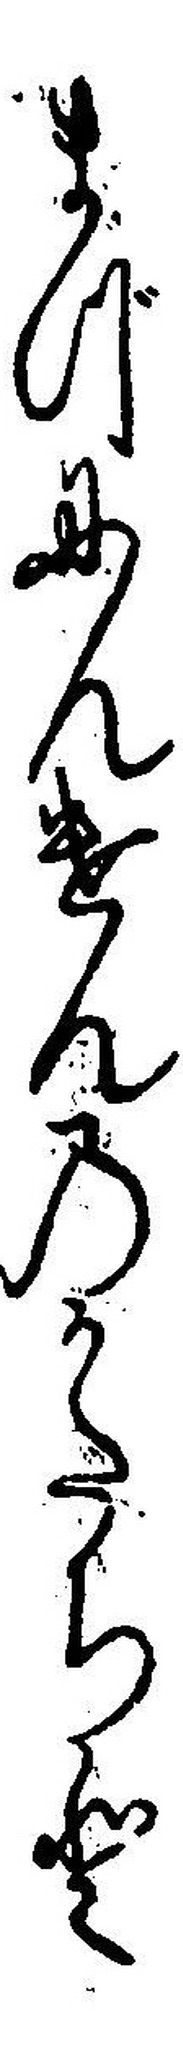まづにんけんのかたちと
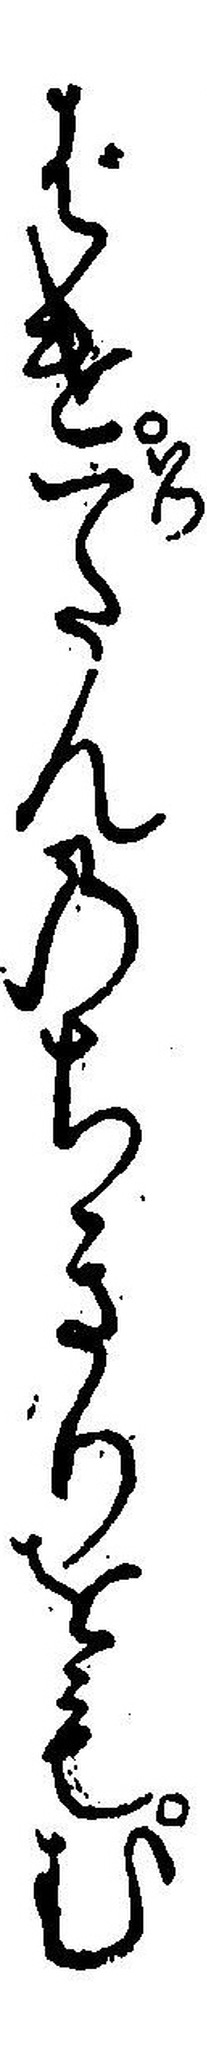ばけ。一たんのちきりをも。む
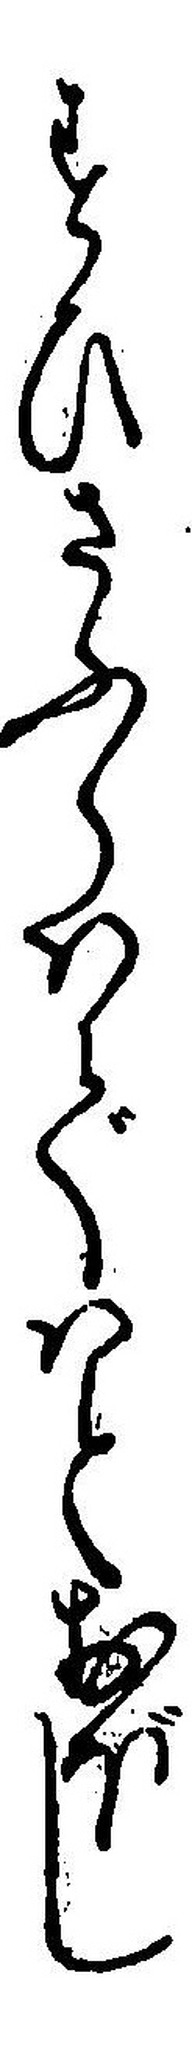すひさふらはではとおぼし
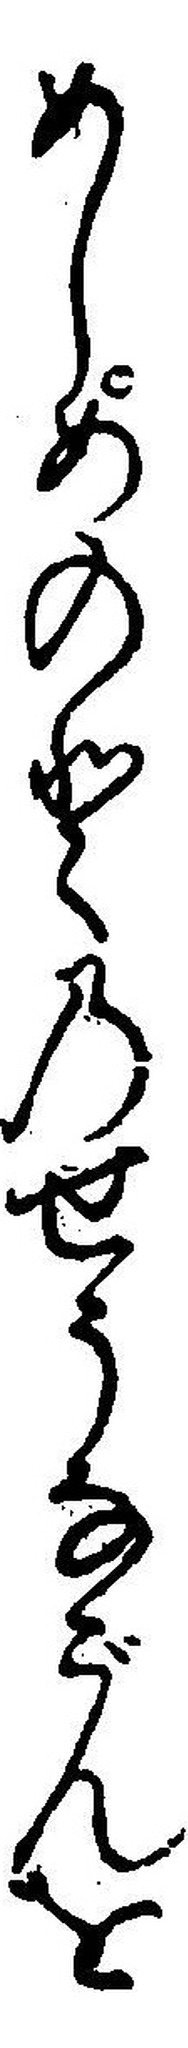めし。めのとのせうなごんを
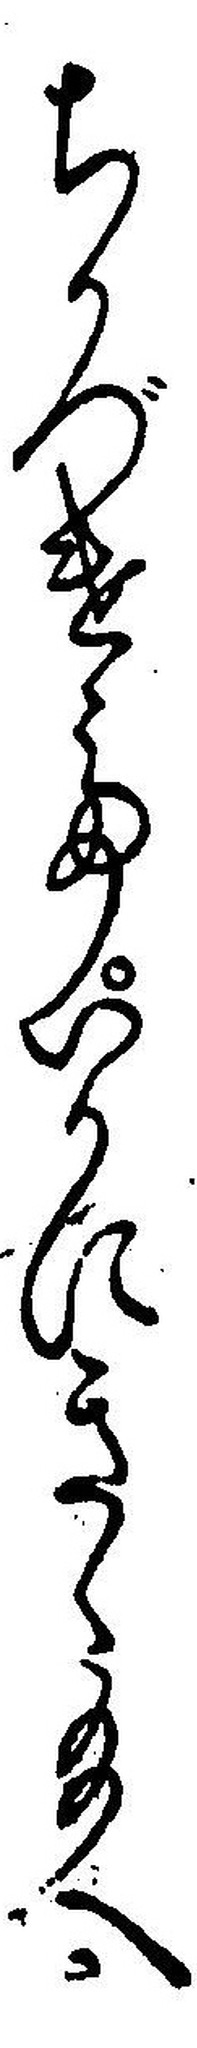ちかづけて。いかにきゝ給へ。
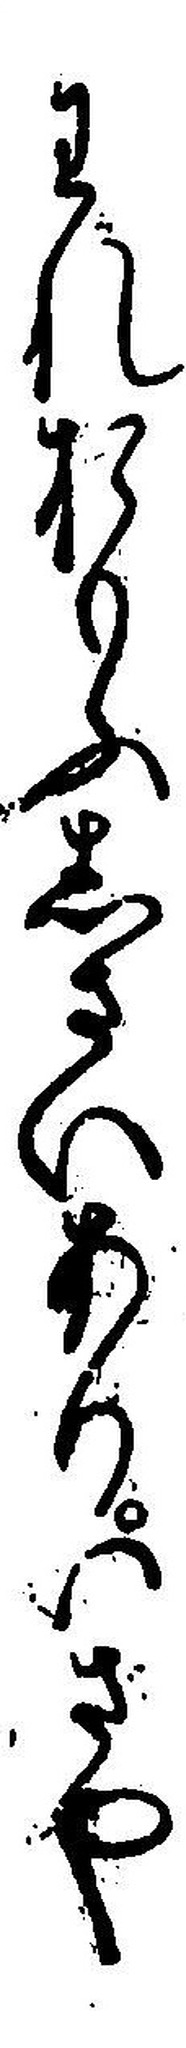われおもふしさいあり。いざや
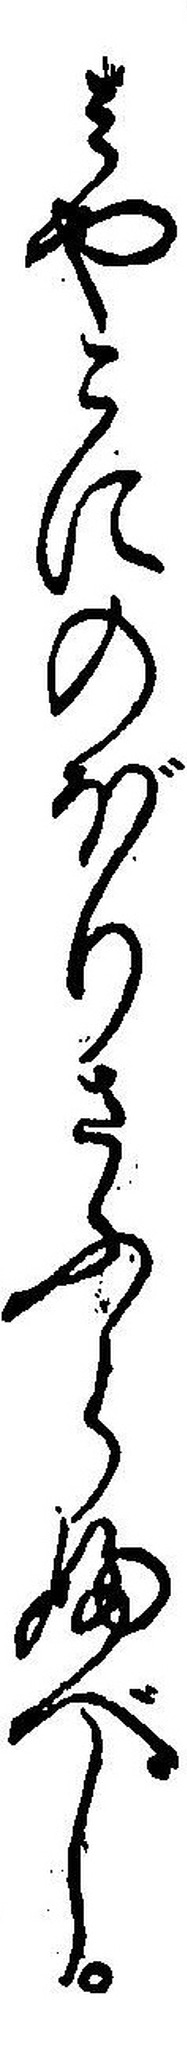みやこにのぼりさふらふべし。
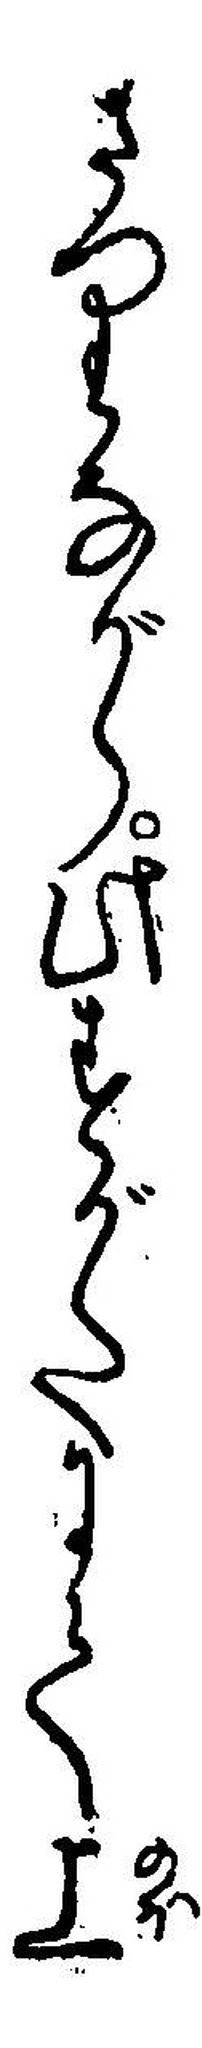さりながら。此すがたにて上
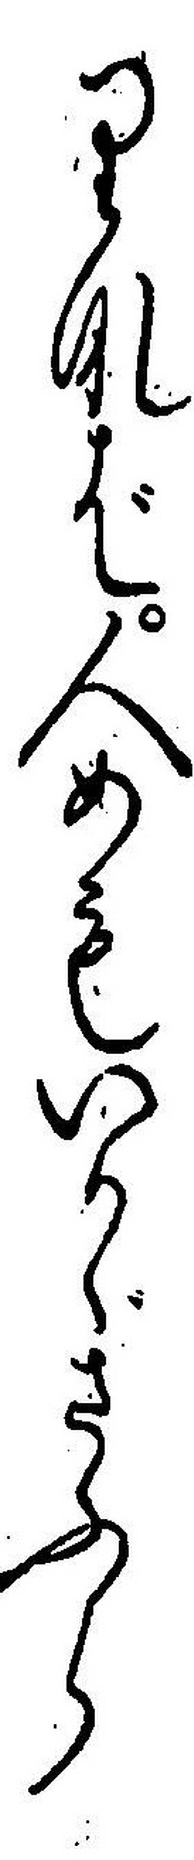りなば。人めもいかゞさふら
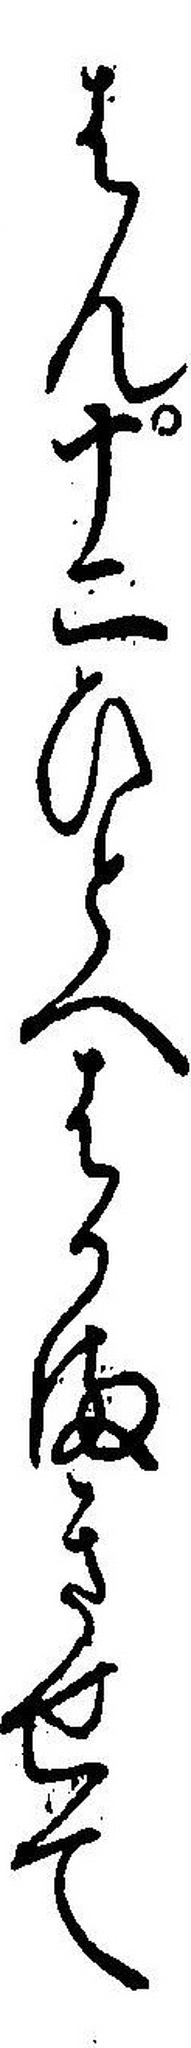はん。十二ひとへはかまきせて
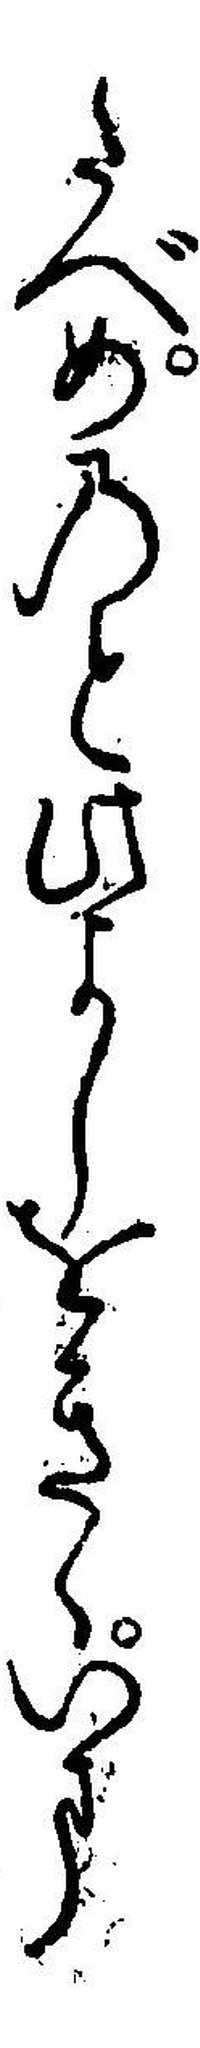たべ。めのと此よしをきゝ。いま
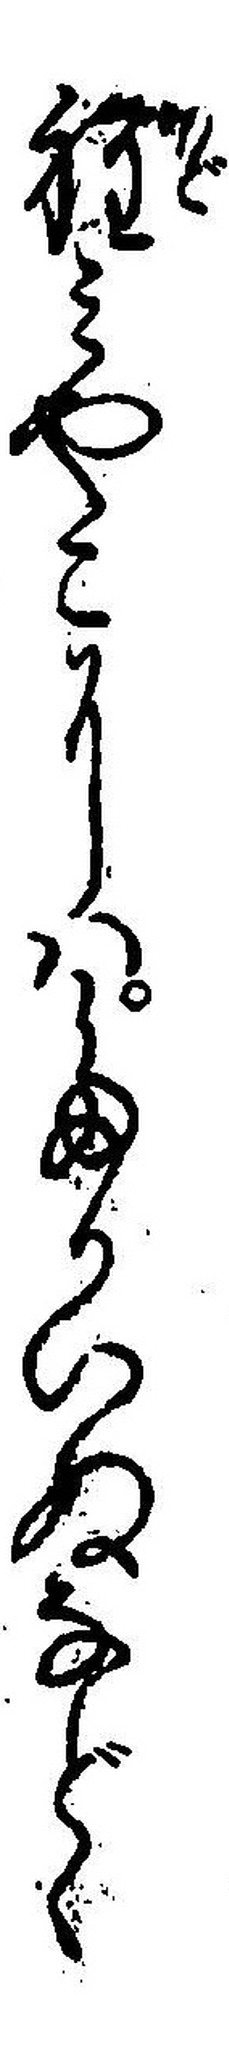程みやこには。たかいぬなどゝ
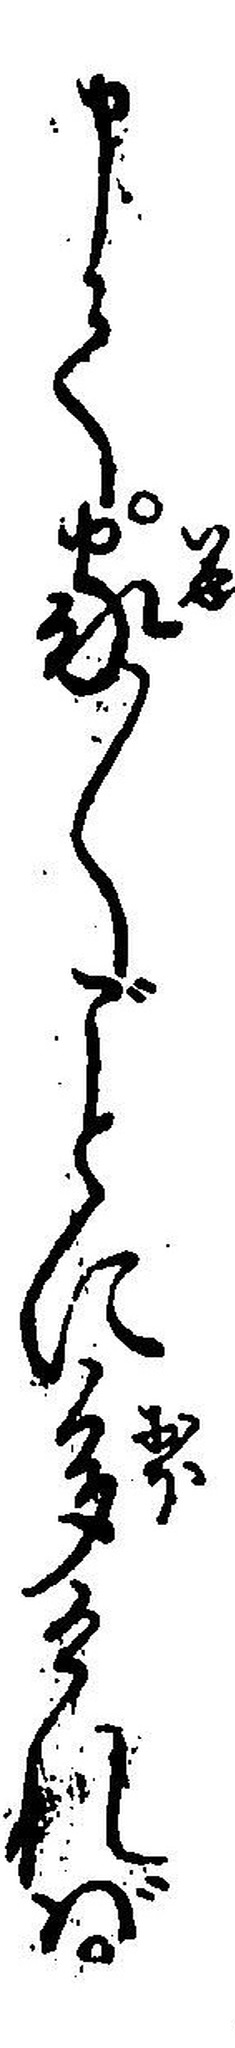申て。家〳〵ごとに多ければ。
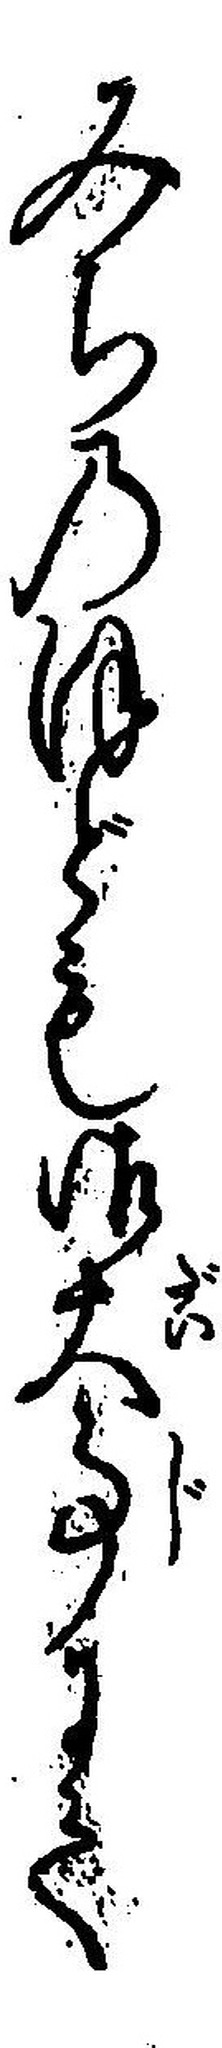みちのほども御大事にて
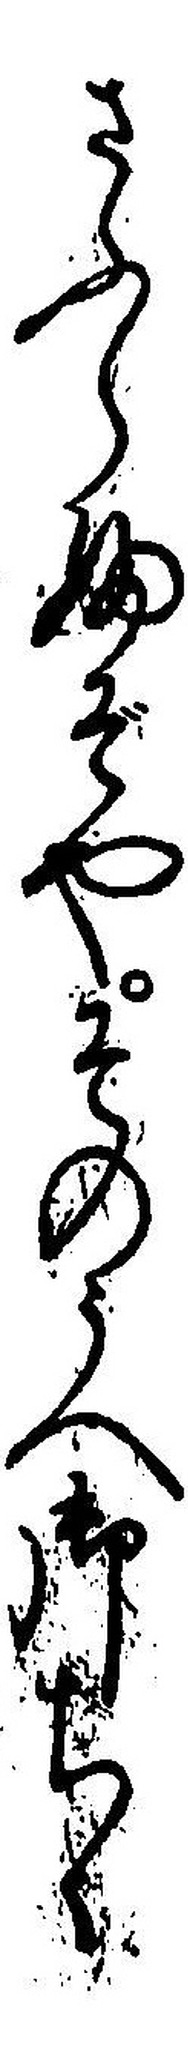さふらふぞや。そのうへ御ちゝ
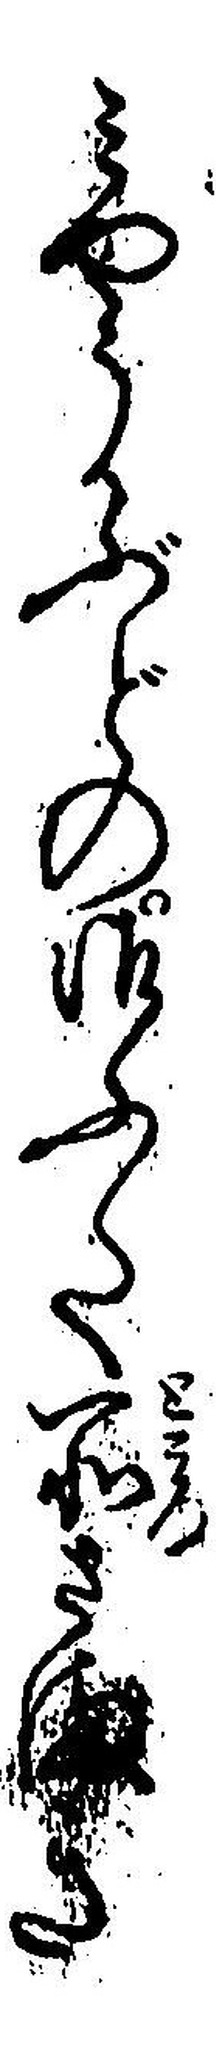みやうぶどの。御ふた所さまき
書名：木幡きつね
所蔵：東京大学総合図書館 General Library in the University of Tokyo, JAPAN
